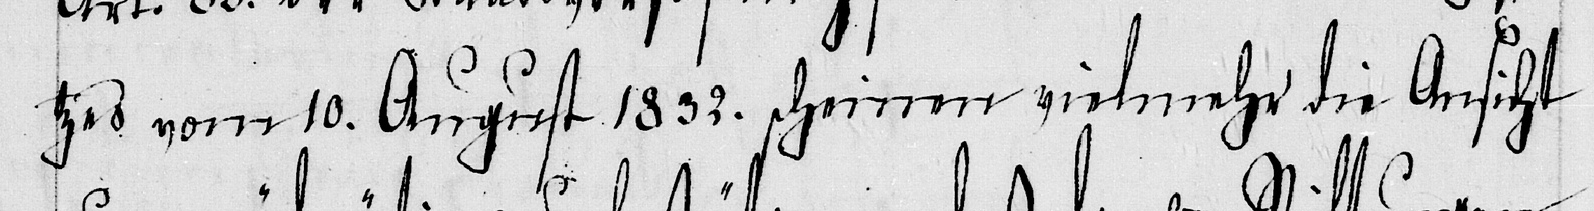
tzes vom 10. August 1832. scheinen vielmehr die Ansicht
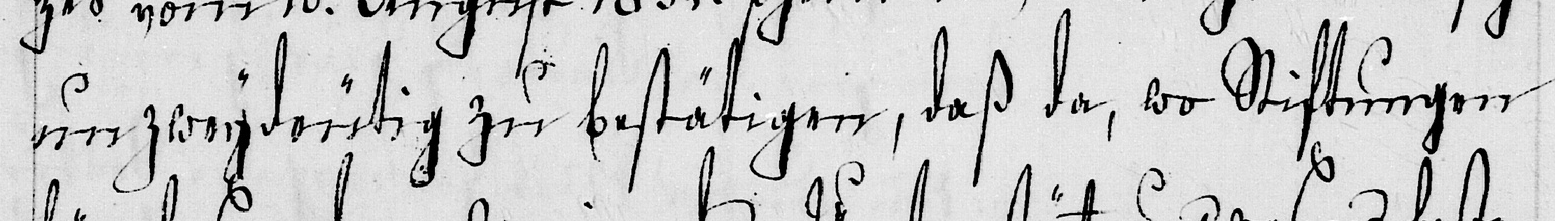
unzweydeutig zu bestätigen, daß da, wo Stiftungen
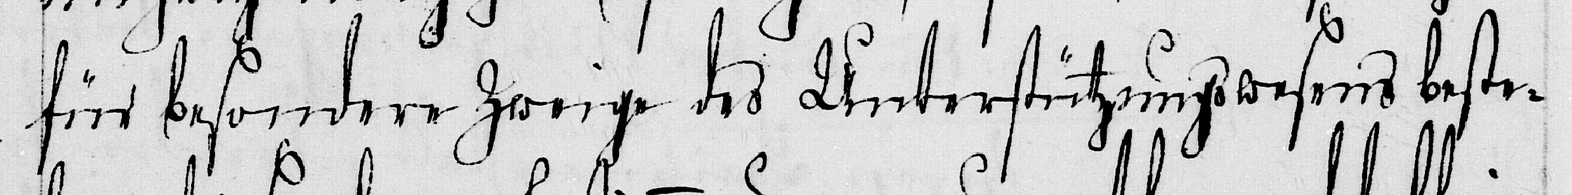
für besondere Zweige des Unterstützungswesens beste¬
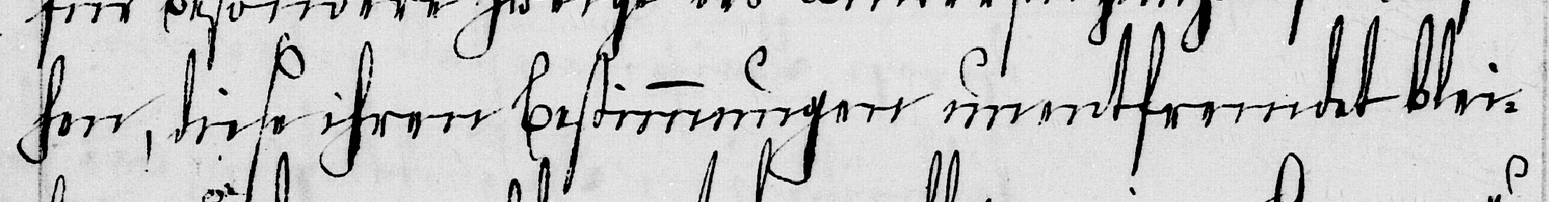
hen, diese ihren Bestimmungen unentfremdet blei¬
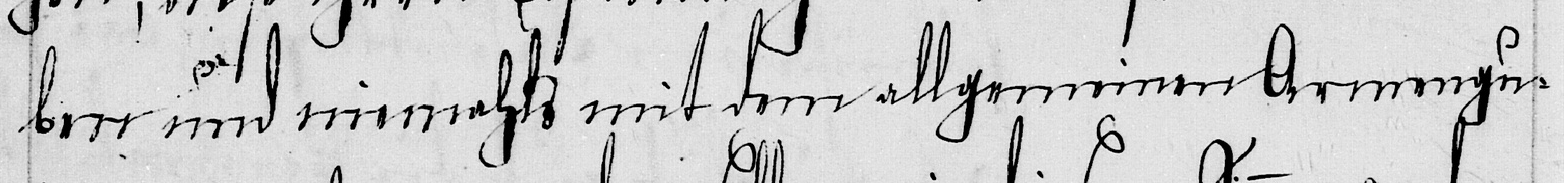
ben und niemahls mit dem allgemeinen Armengu¬
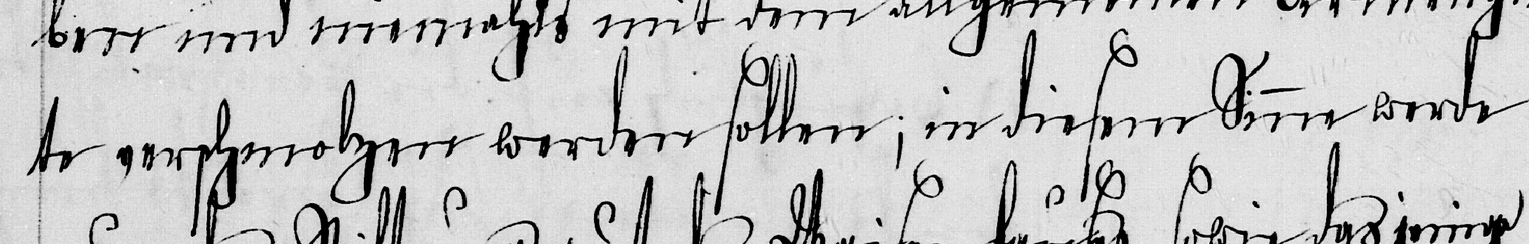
te verschmolzen werden sollen; in diesem Sinne werde
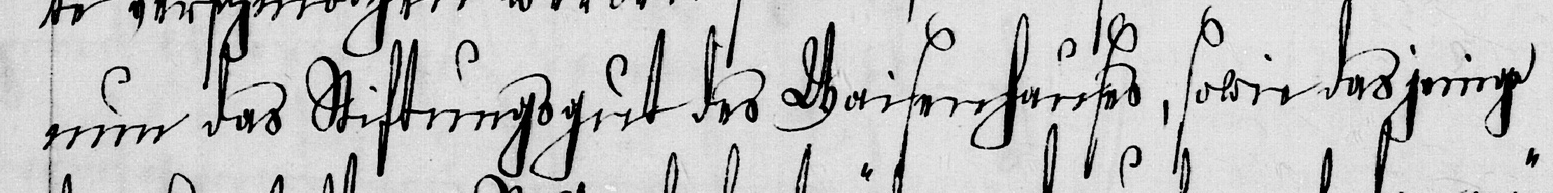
nun das Stiftungsgut des Waisenhauses, sowie dasjenige
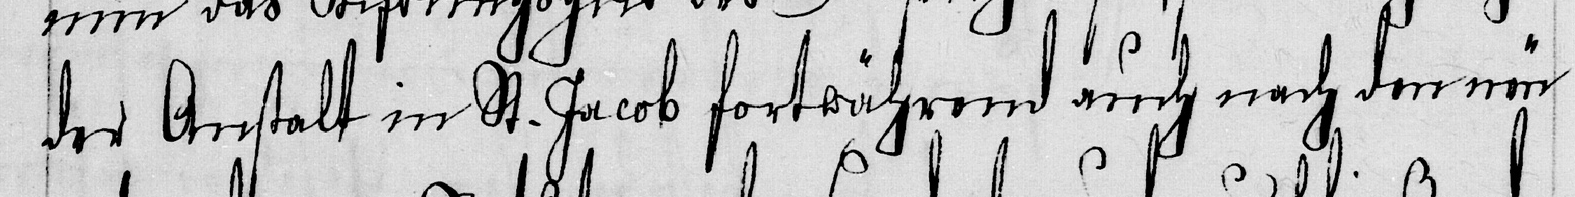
der Anstalt im St. Jacob fortwährend auch nach den neu
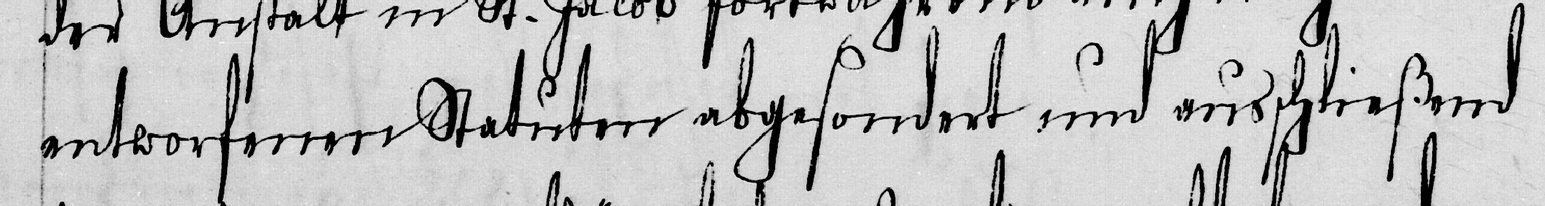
entworfenen Statuten abgesondert und ausschließend
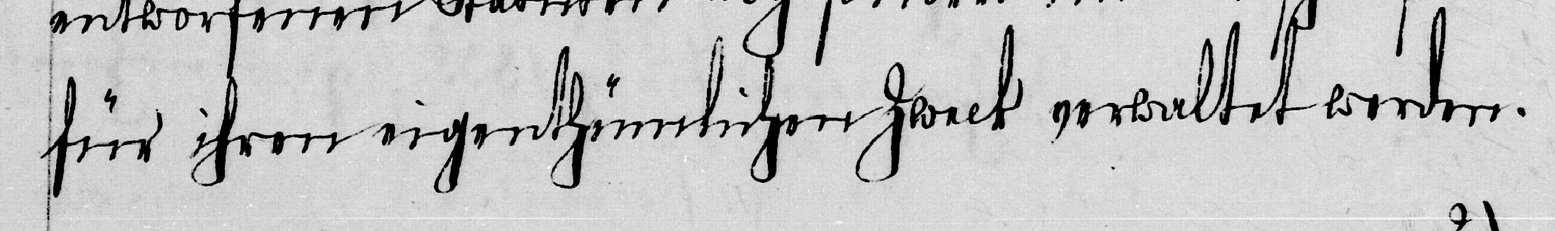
für ihren eigenthümlichen Zweck verwaltet werden.
